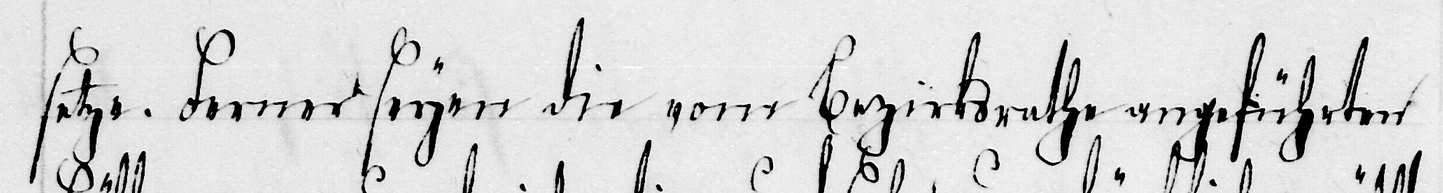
setze. Ferner seyen die vom Bezirksrathe angeführten
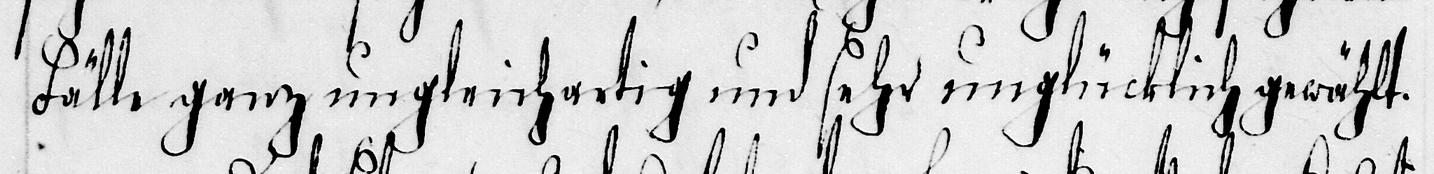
Fälle ganz ungleichartig und sehr unglücklich gewählt.
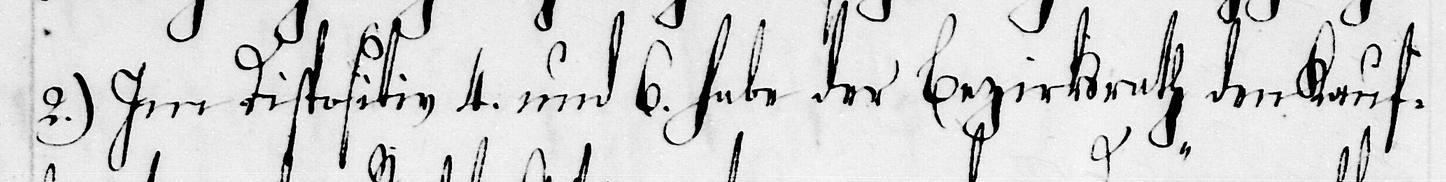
2.) Im Dispositiv 4. und 6. habe der Bezirksrath den Kauf¬
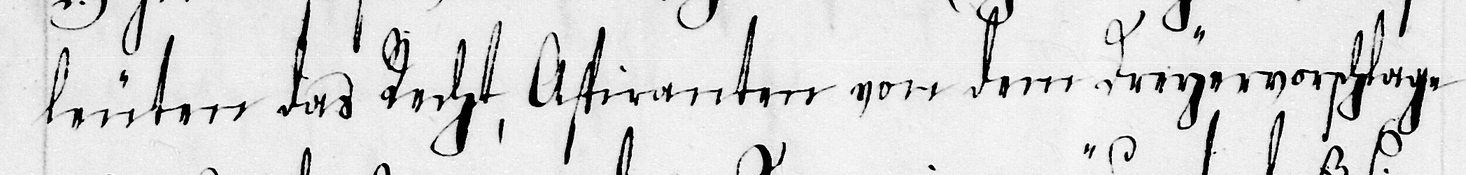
leuten das Recht, Aspiranten von dem Dreyervorschlage
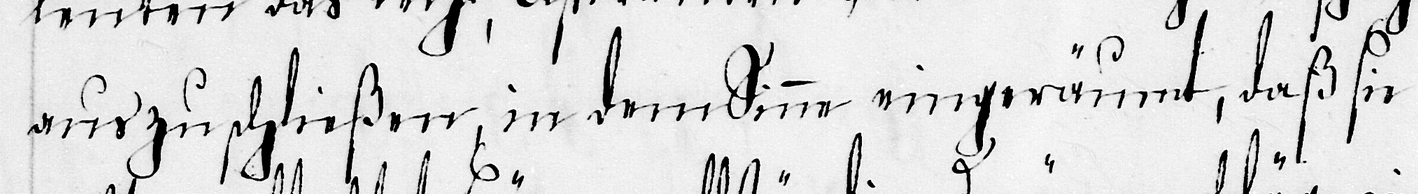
auszuschließen, in dem Sinne eingeräumt, daß sie
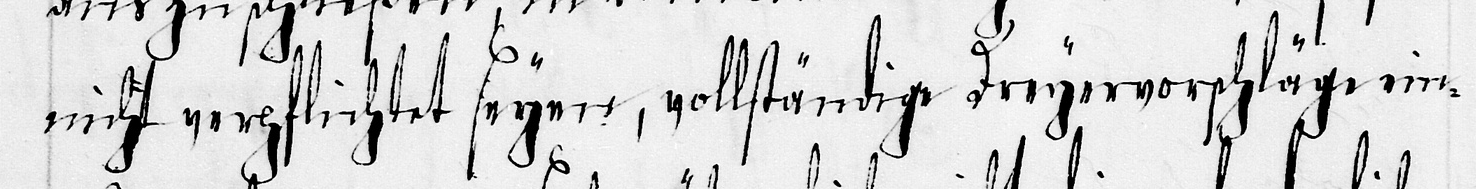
nicht verpflichtet seyen, vollständige Dreyervorschläge ein¬
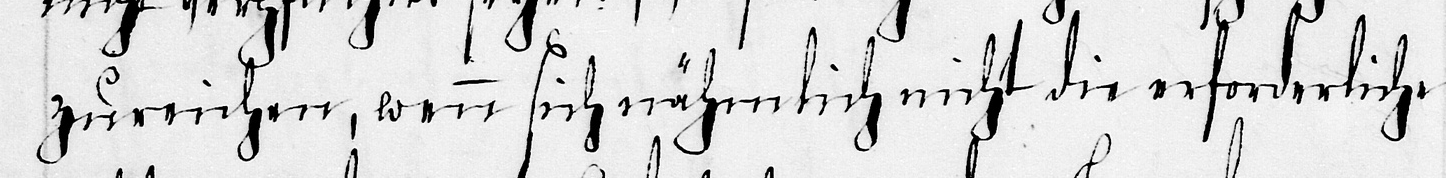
zureichen, wenn sich nämlich nicht die erforderliche
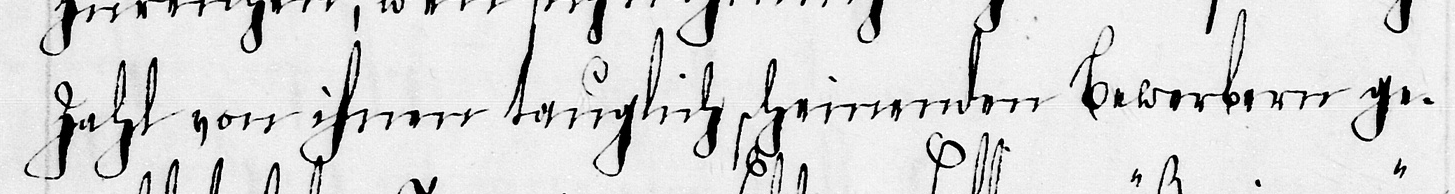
Zahl von ihnen tauglich scheinenden Bewerbern ge¬
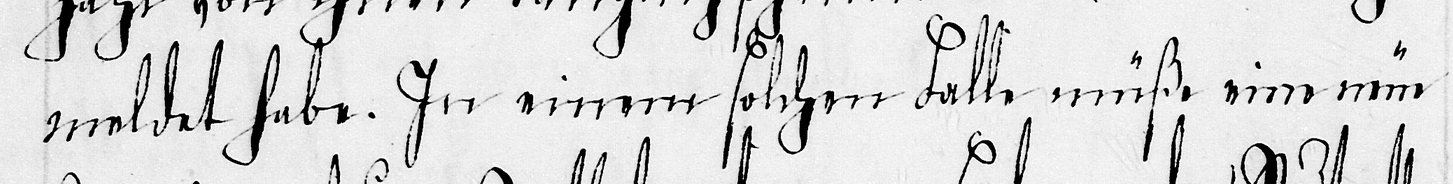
meldet habe. In einem solchen Falle müße eine neue
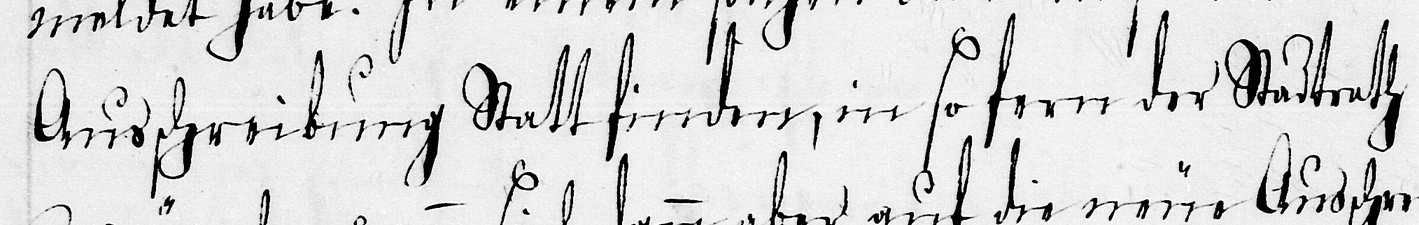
Ausschreibung Statt finden, in so fern der Stadtra¬
